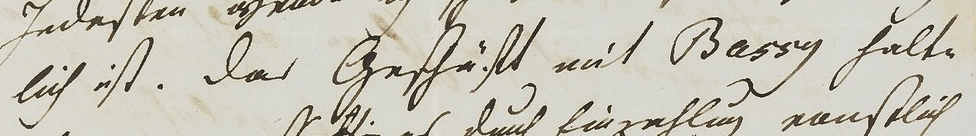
lich ist. Das Geschäft mit Bassy halte
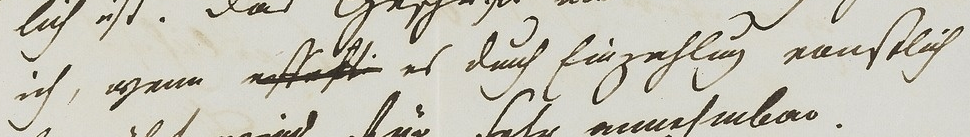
ich, wenn effekti es durch Einzahlung ernstlich
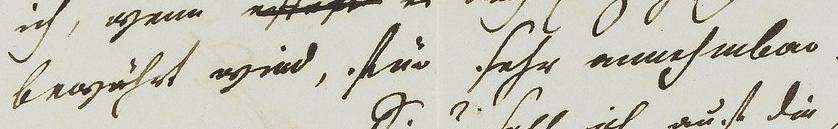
bewährt wird, für sehr annehmbar.
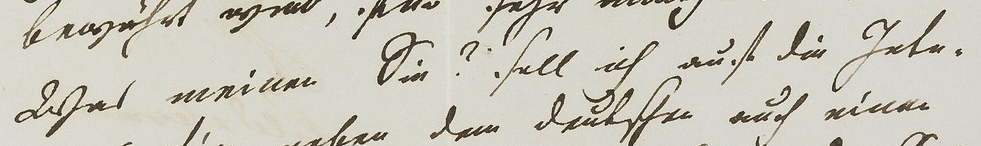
Was meinen Sie? soll ich auf die Inte-
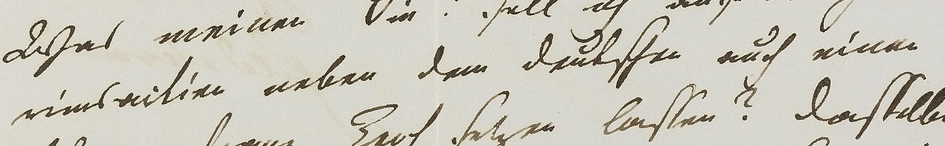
rimsactien neben dem deutschen auch einen
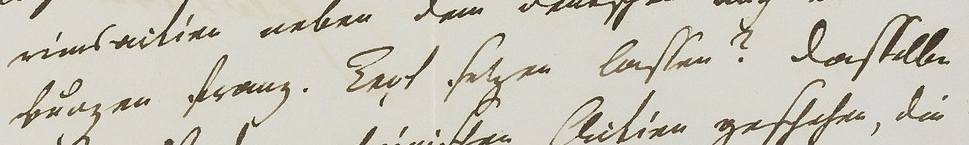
kurzen franz. Text setzen lassen? dasselbe
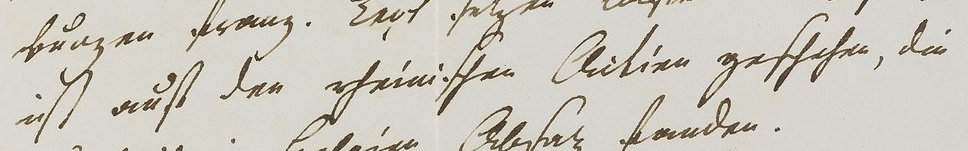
ist auf den rheinischen Actien geschehen, die
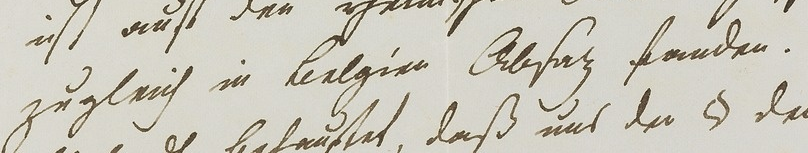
zugleich in Belgien Absatz fanden.
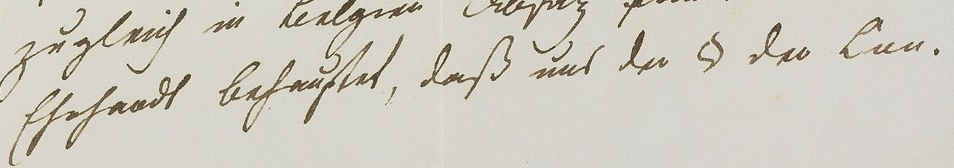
Ehrhardt behauptet, daß uns der § der Con-
